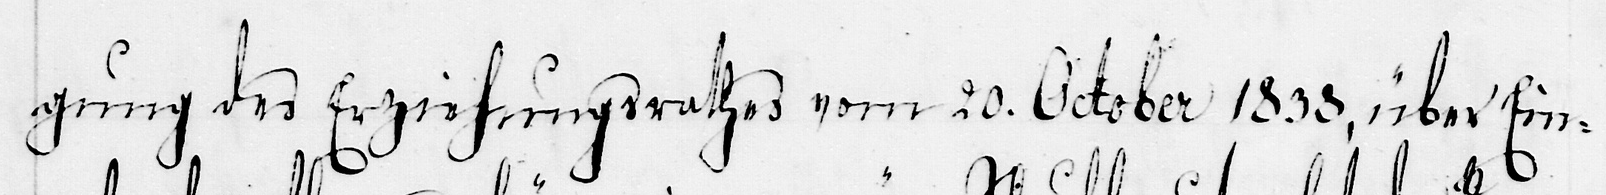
gung des Erziehungsrathes vom 20. October 1838, über Ein¬
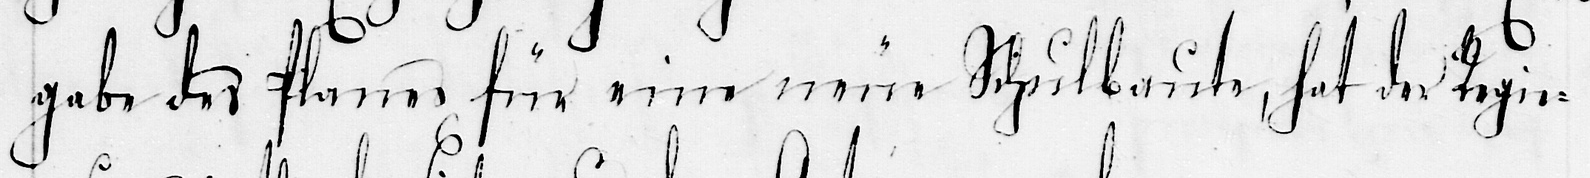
gabe des Planes für eine neue Schulbaute, hat der Regie¬
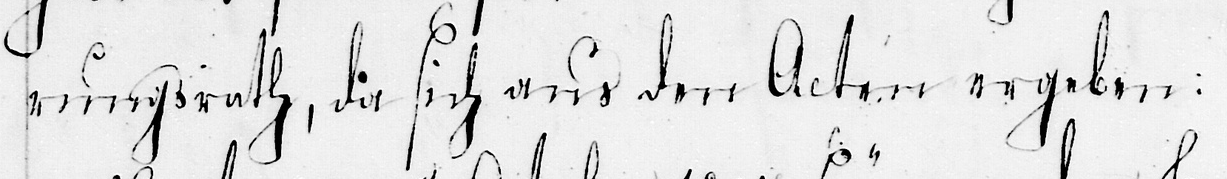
rungsrath, da sich aus den Acten ergeben:
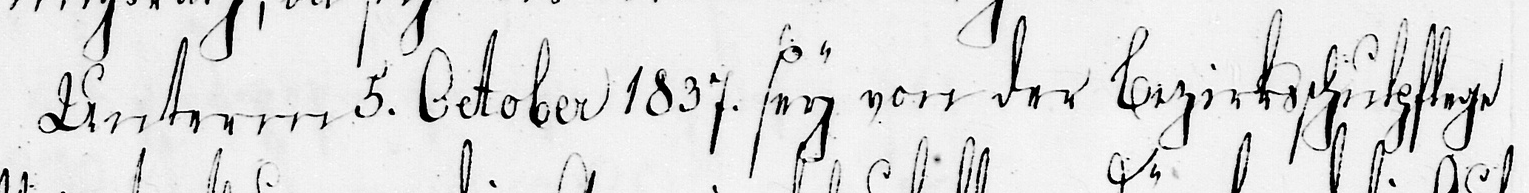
Unterm 5. October 1837. sey von der Bezirksschulpflege
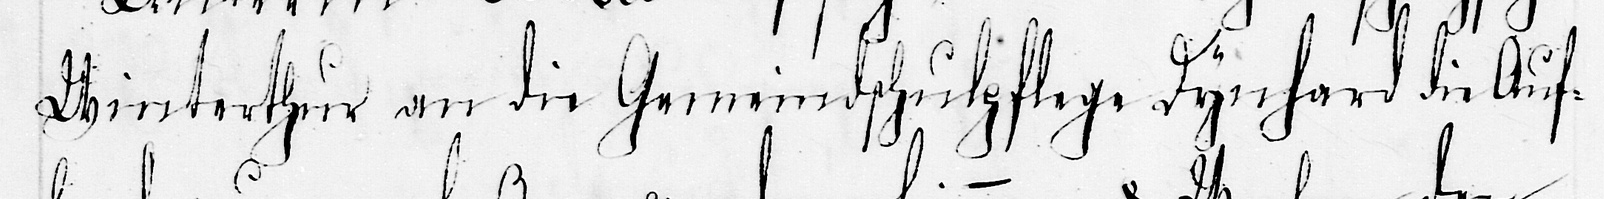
Winterthur an die Gemeindschulpflege Dynhard die Auf¬
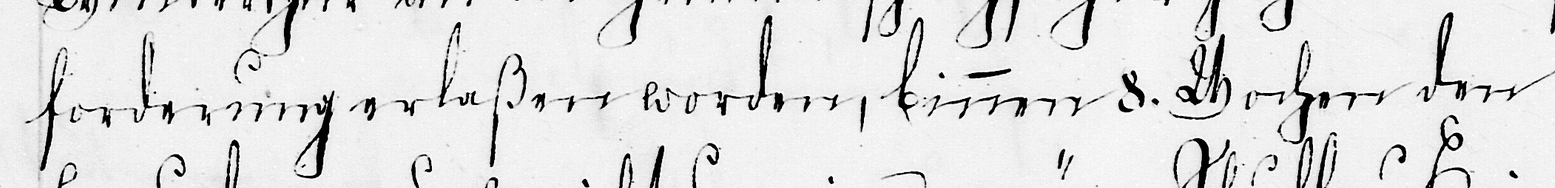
forderung erlaßen worden, binnen 8. Wochen den
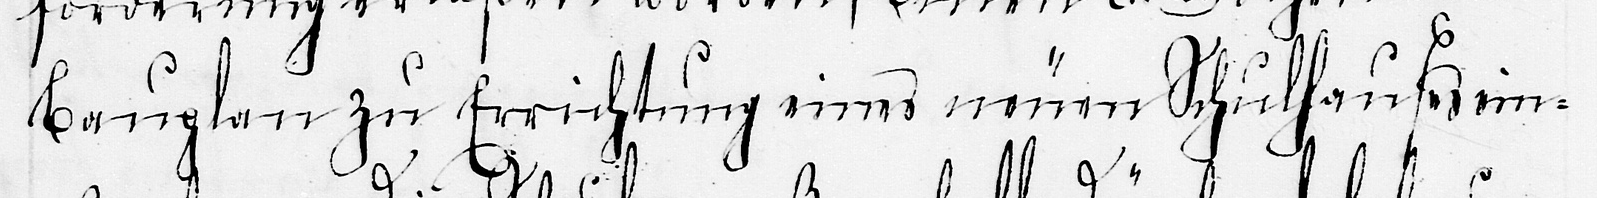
Bauplan zu Errichtung eines neuen Schulhauses ein¬
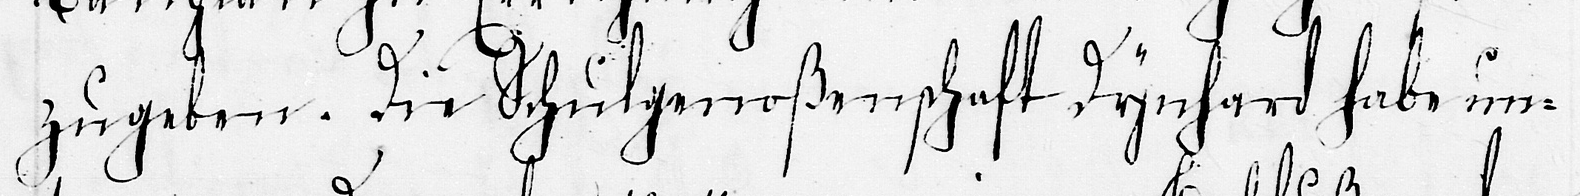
zugeben. Die Schulgenoßenschaft Dynhard habe un¬
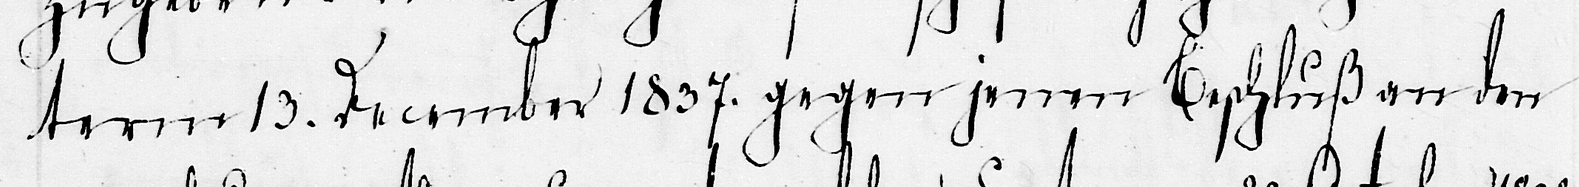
term 13. December 1837. gegen jenen Beschluß an den
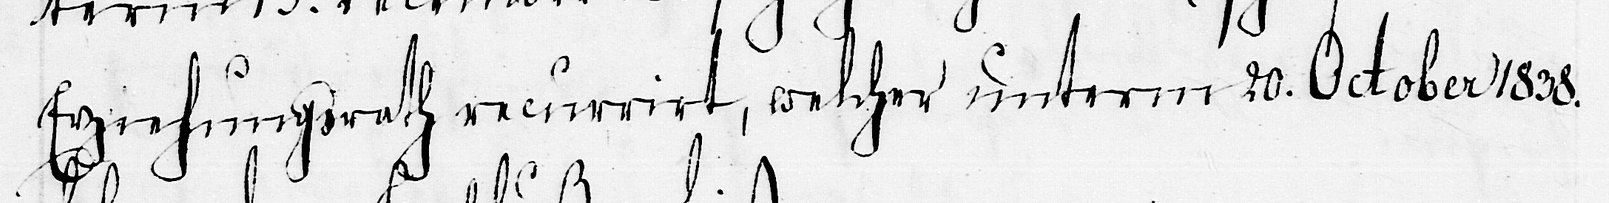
Erziehungsrath recurrirt, welcher unterm 20. October 1838.
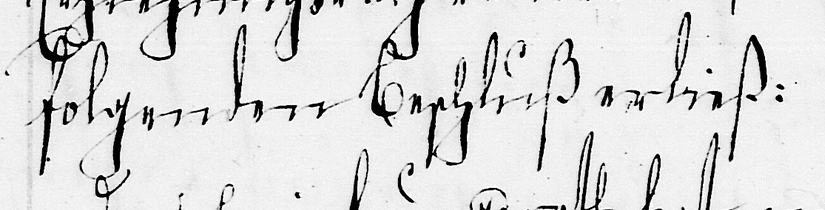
folgenden Beschluß erließ:
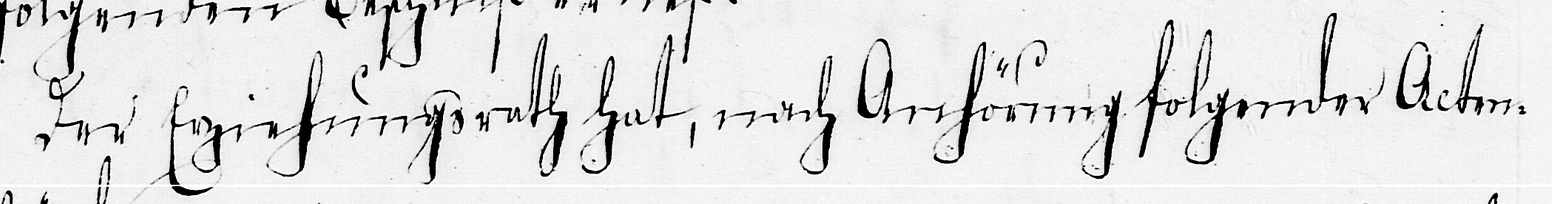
Der Erziehungsrath hat, nach Anhörung folgender Acten¬
